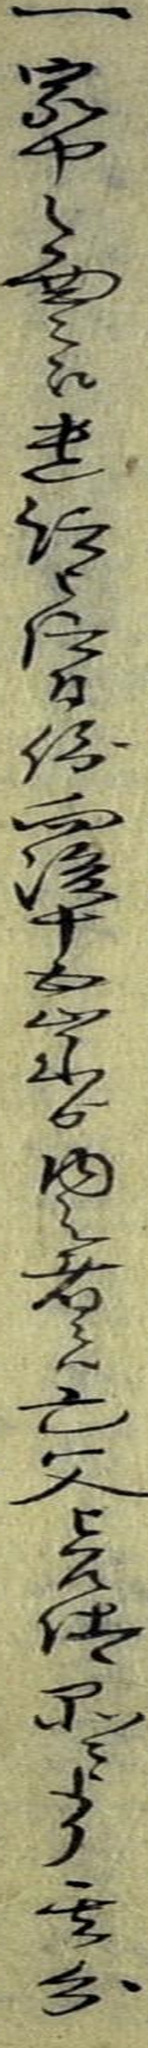一家中之面々江遺跡被仰付儀向後十五歳より内之者ニハ亡父被召仕候品ニより其分
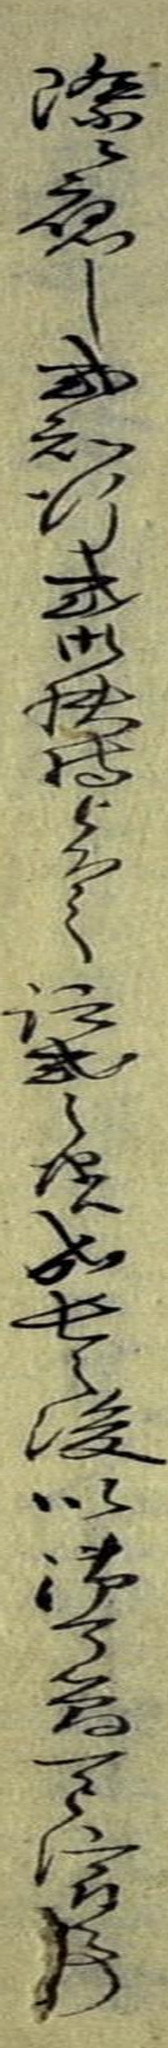際ニ応し或知行或御扶持被下之跡式之儀ハ成長之後以御了簡可被仰付事
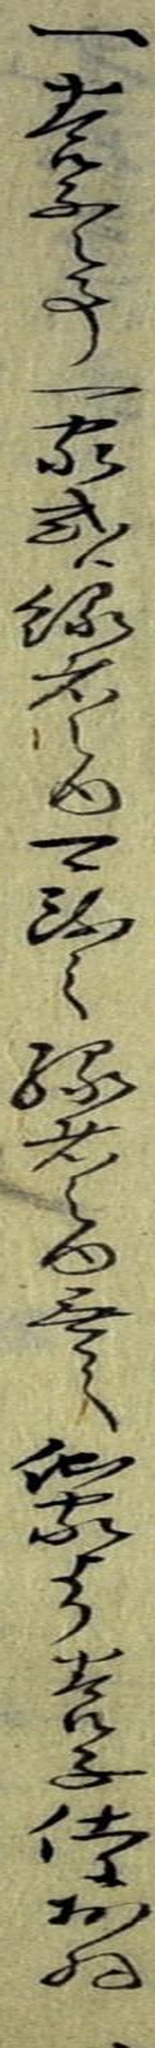一養子之事一家或ハ縁者之内可致之縁者之内無之他家より養子仕におゐ
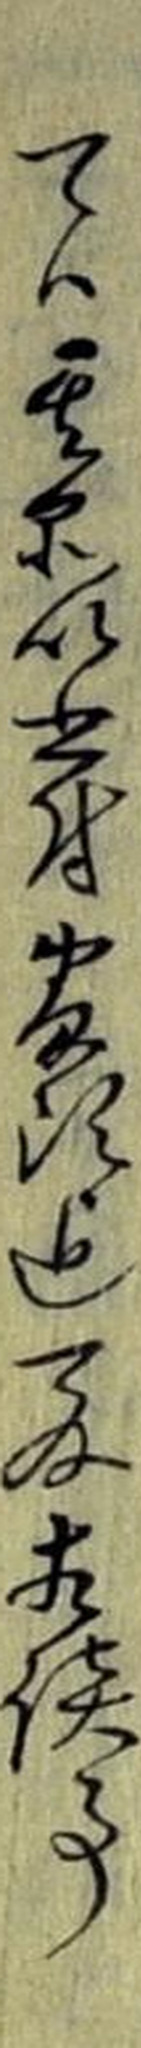てハ其品以書付番頭迄可及相談事
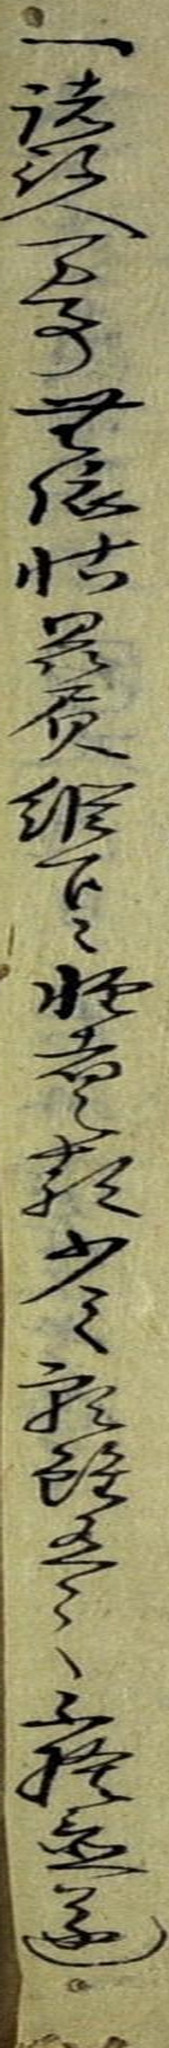一諸役人万事無依怙贔屓縦下々軽者之類少之願雖有之不捨置遂
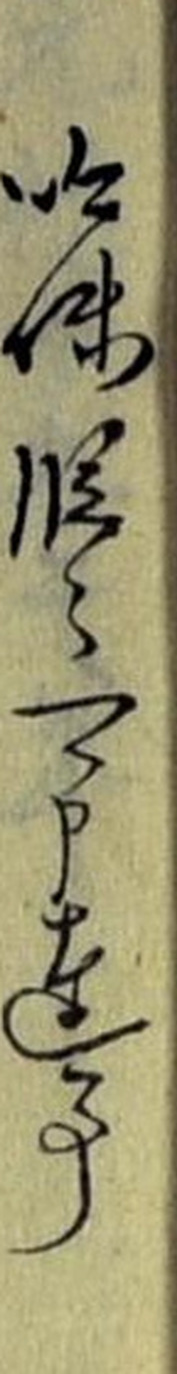吟味段々可申達事
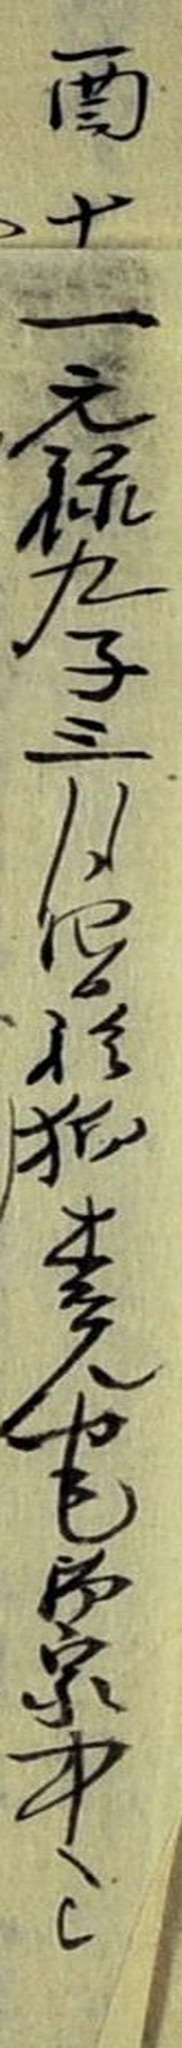一元禄九子三月四日於狛木工允宅御家中へ被
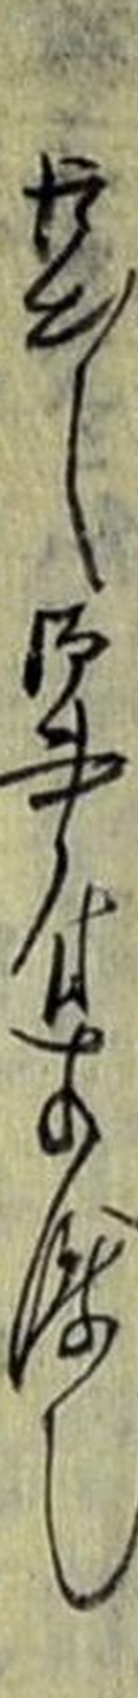仰出之御書付相渡申候
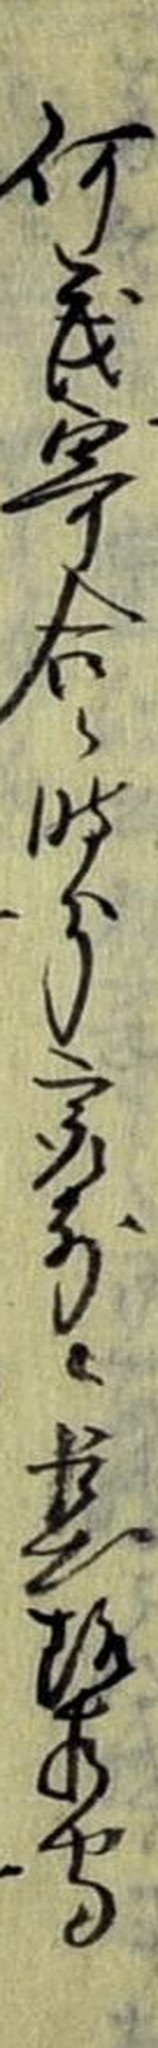何茂寄合候時分最前被仰出趣相守
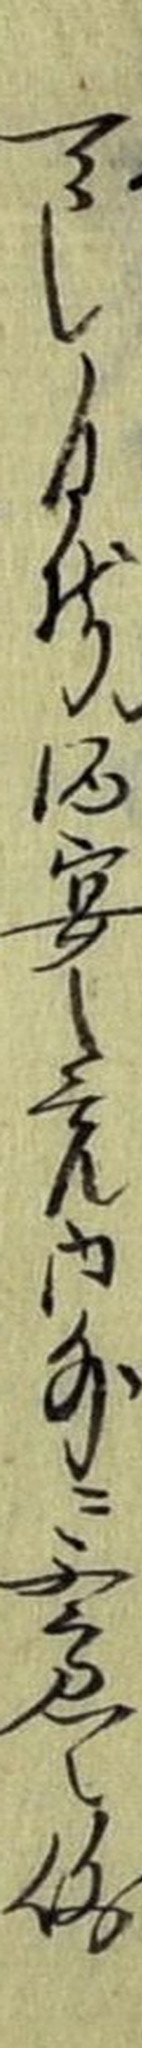可申候自然酒宴之節内外ニ不慮之儀
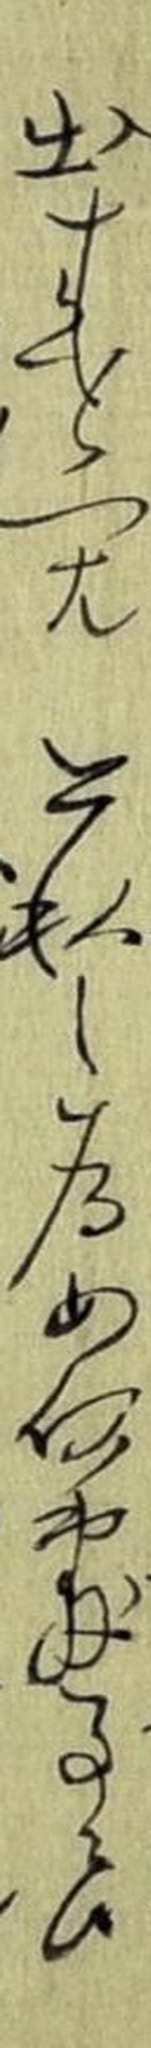出来候へ共公私之為如何敷事ニ候
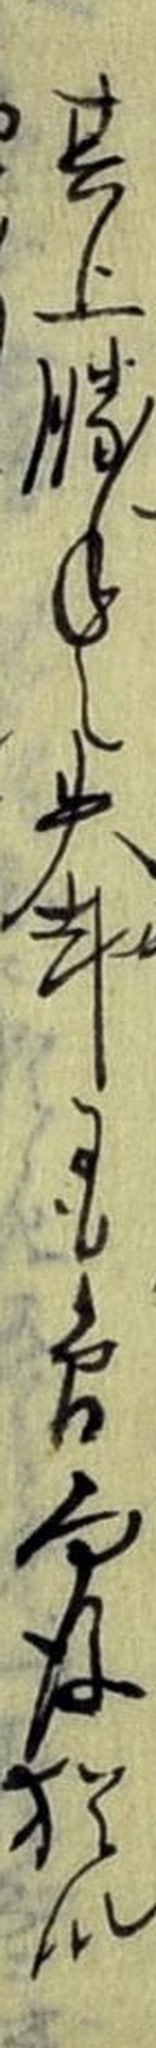其上勝手之失却にも候間向後猶以
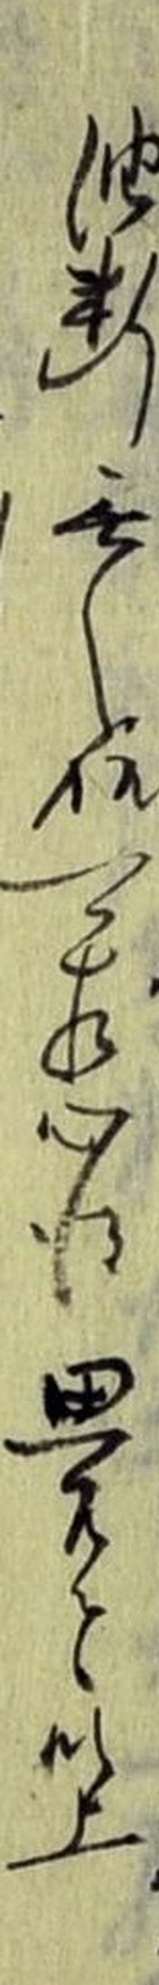油断無之様可相心得思召ニ候以上
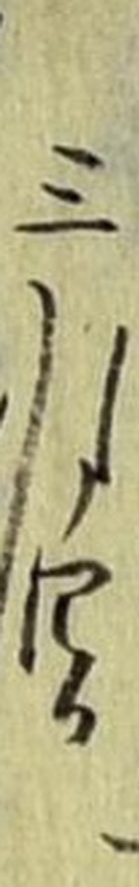三月四日
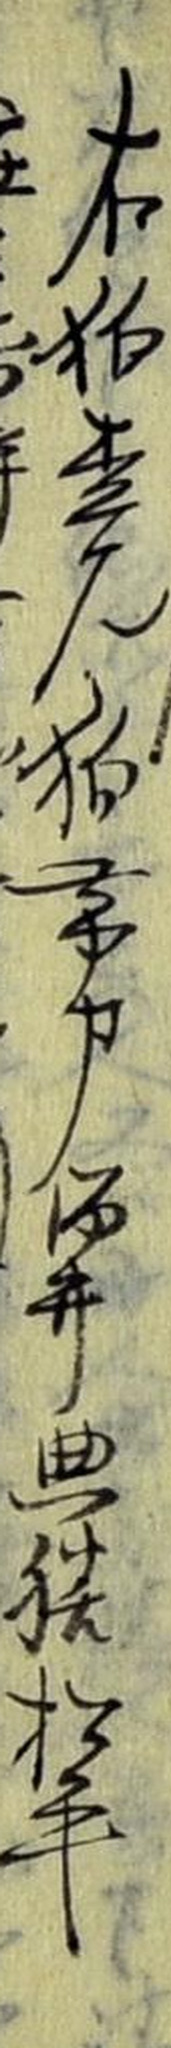右狛木工允狛帯刀酒井典膳松平
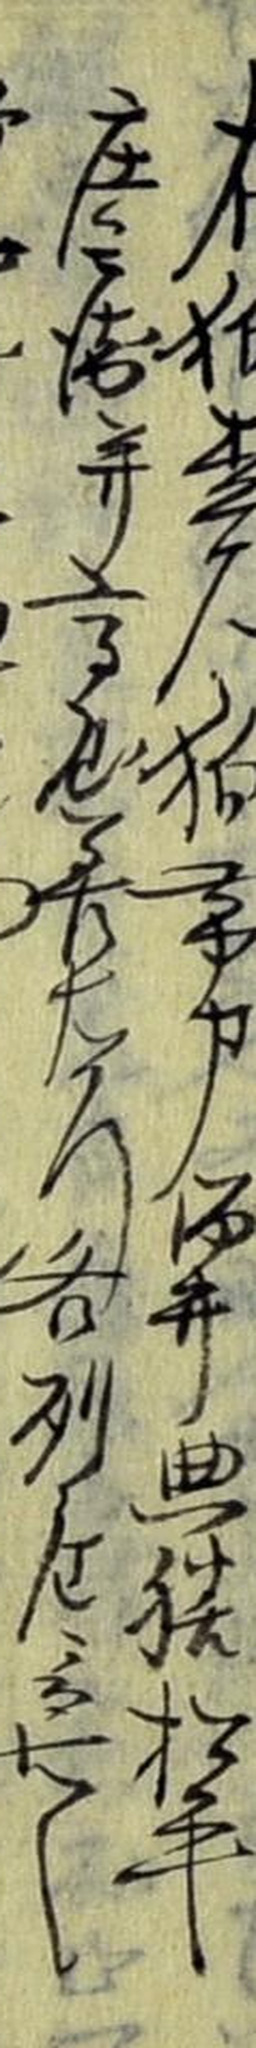庄兵衛并高屋善右衛門各列座ニ而右之
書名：命令之部 一
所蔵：福井県文書館 Fukui Prefectural Archives
